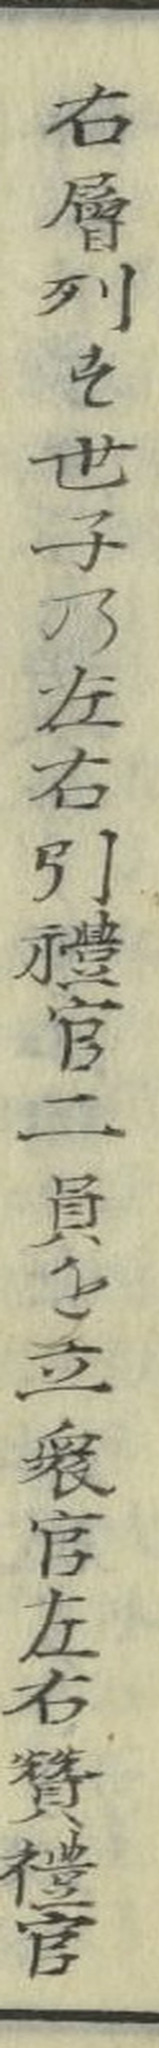右層列す世子の左右引礼官二員を立衆官左右賛礼官
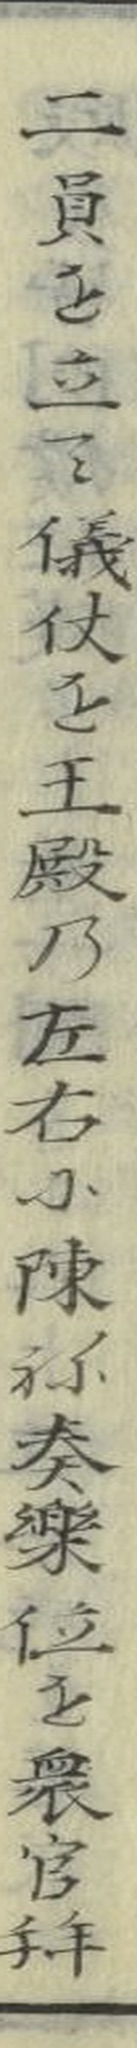二員を立て儀仗を王殿の左右に陳祢奏楽位を衆官拝
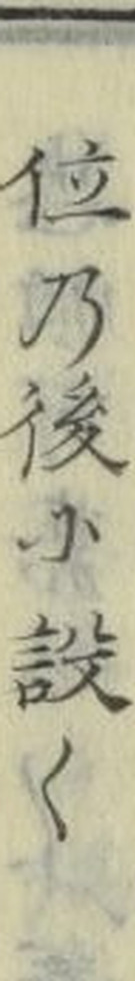位の後に設く
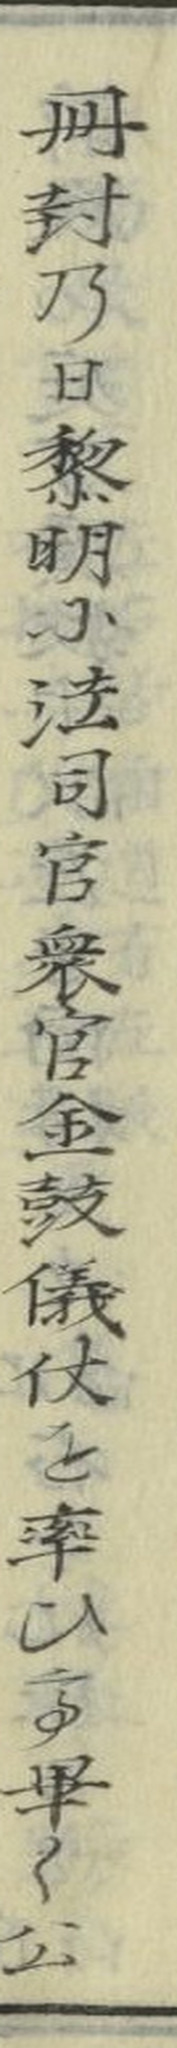冊封の日黎明に法司官衆官金鼓儀仗を率ひて畢く公
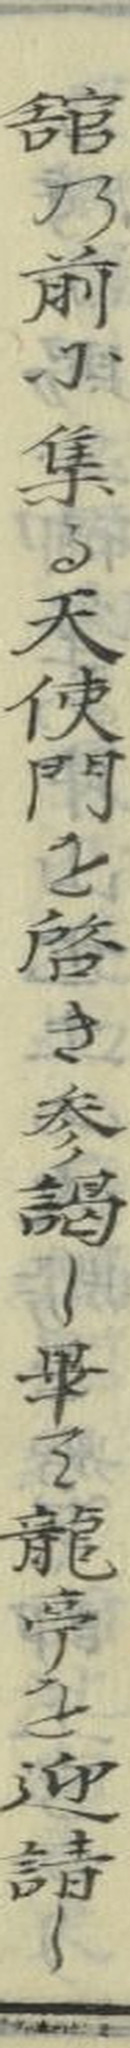館の前に集る天使門を啓き参謁し畢て龍亭を迎請し
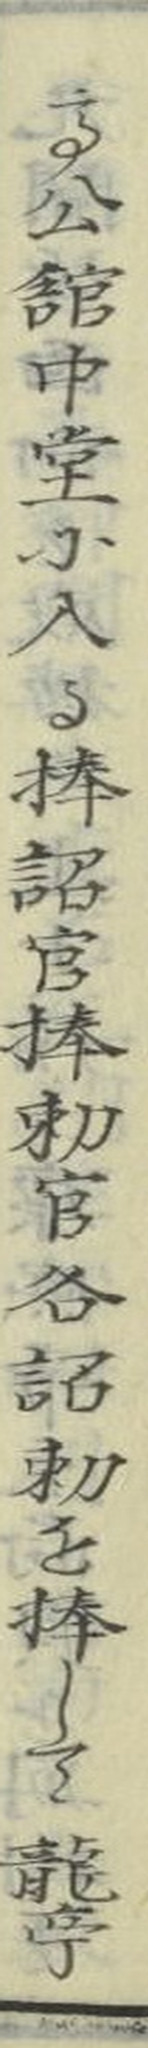て公館中堂に入る捧詔官捧勅官各詔勅を捧して龍亭
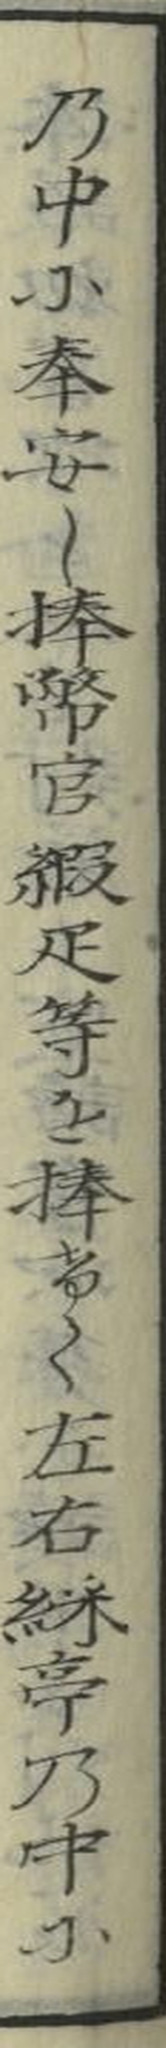の中に奉安し捧幣官縀疋等を捧けて左右綵亭の中に
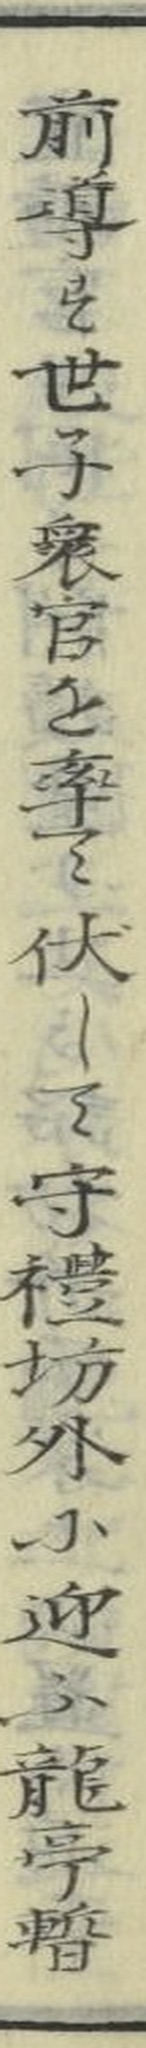前導す世子衆官を率て伏して守礼坊外に迎ふ龍亭暫
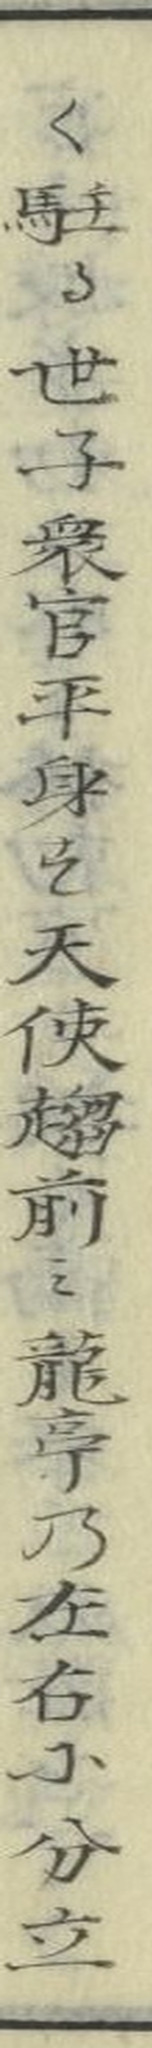く駐る世子衆官平身す天使趨前み龍亭の左右に分立
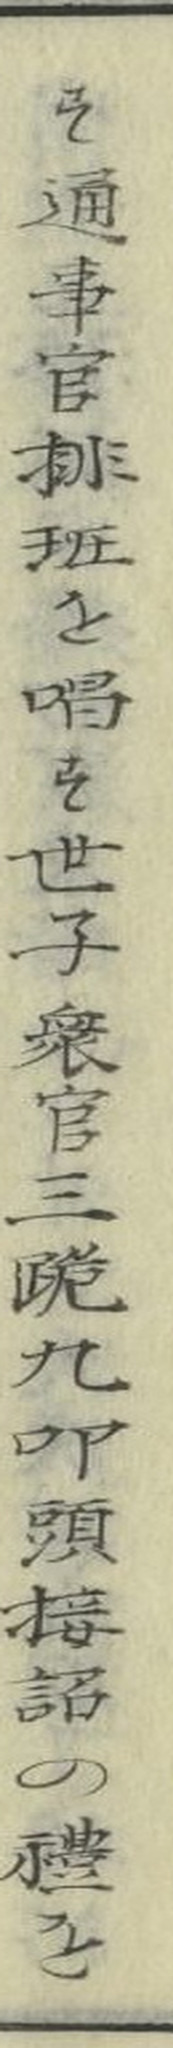す通事官排班を唱す世子衆官三跪九叩頭接詔の礼を
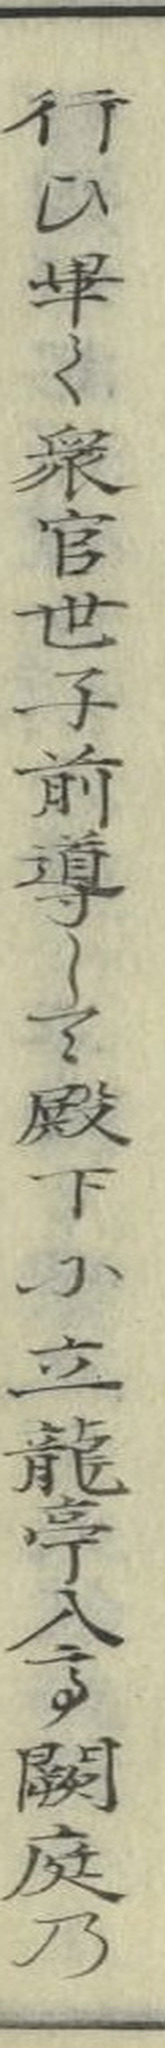行ひ畢て衆官世子前導して殿下に立龍亭入て闕庭の
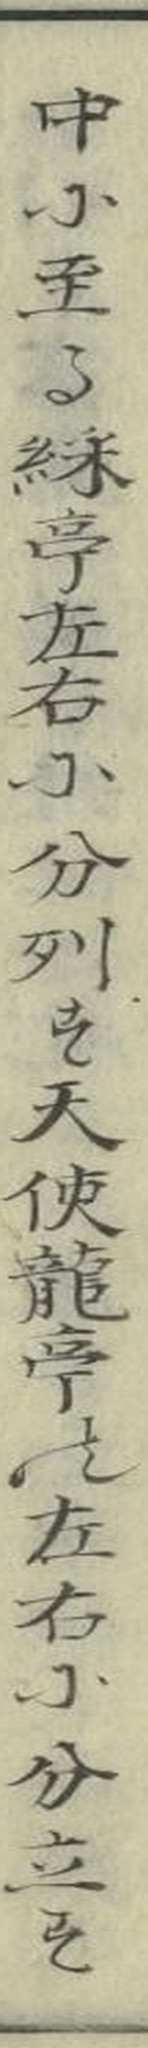中に至る綵亭左右に分列す天使龍亭の左右に分立す
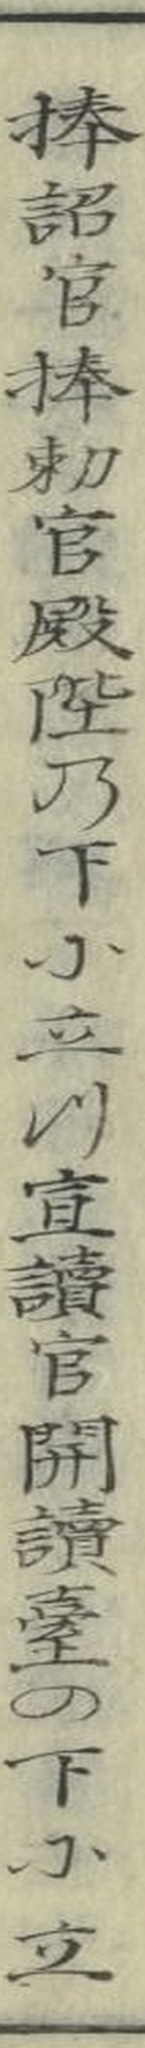捧詔官捧勅官殿陛の下に立つ宣読官開読台の下に立
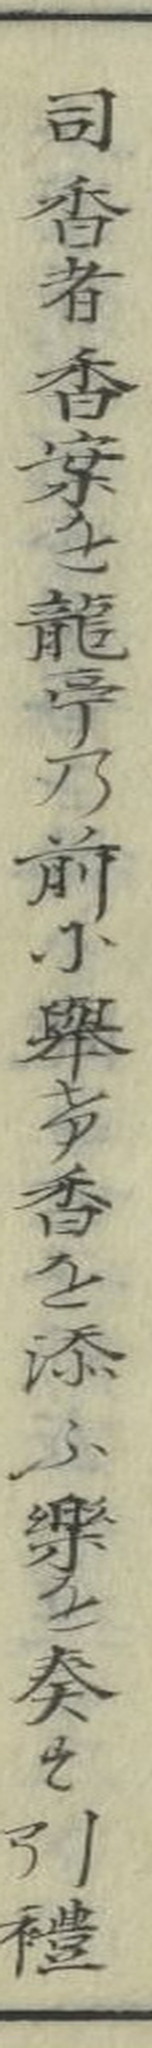司香者香案を龍亭の前に挙け香を添ふ楽を奏す引礼
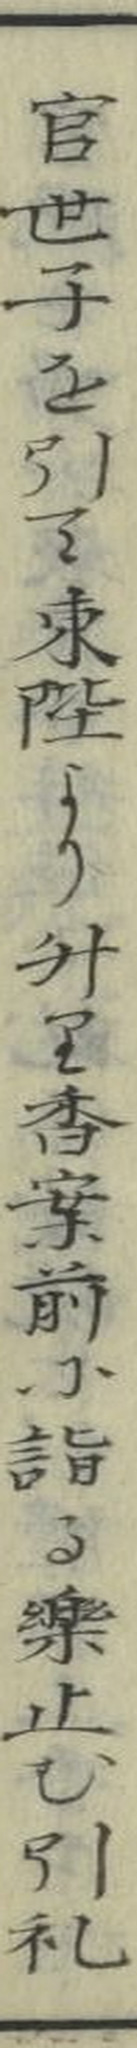官世子を引て東陛より升り香案前に詣る楽止む引礼

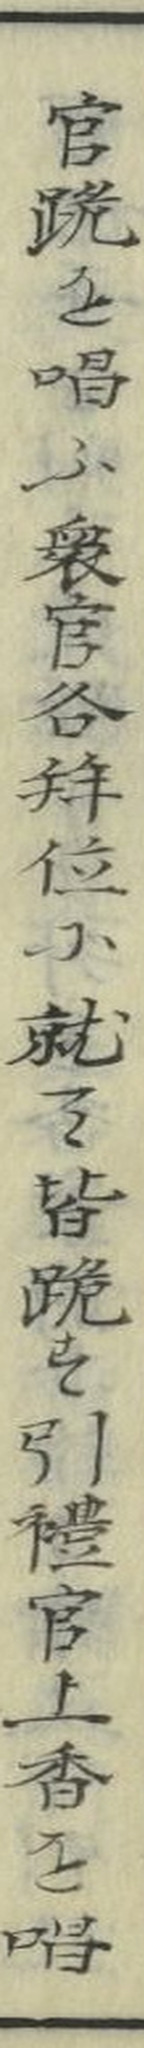官跪を唱ふ衆官各拝位に就て皆跪す引礼官上香を唱
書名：琉球沿革志 下
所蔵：University of the Ryukyus Library
